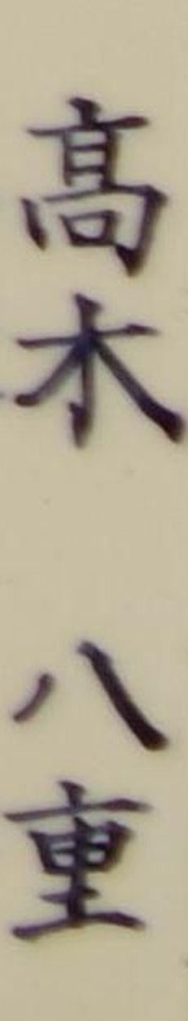高木八重
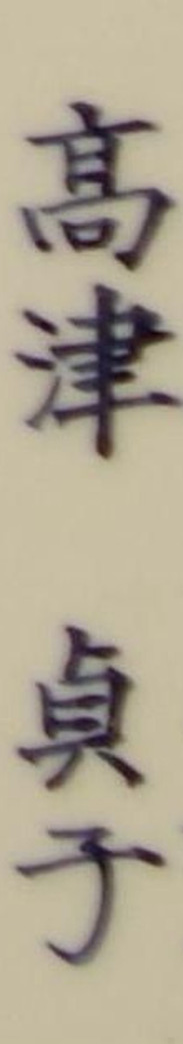高津貞子
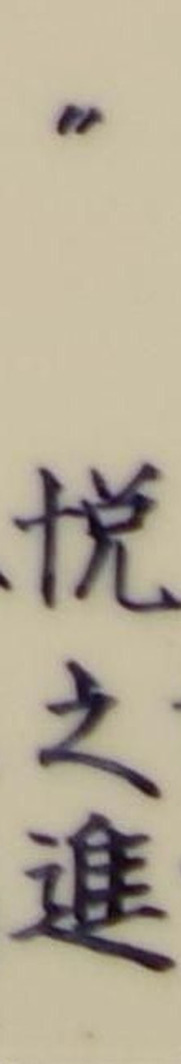悦之進
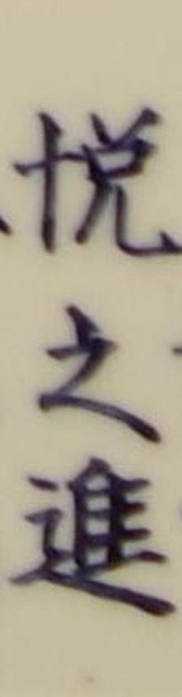悦之進
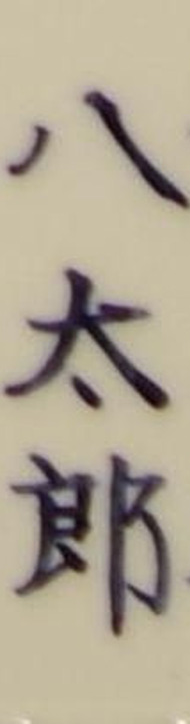八太郎
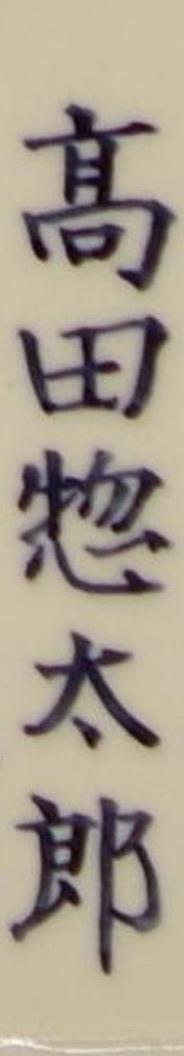高田惣太郎
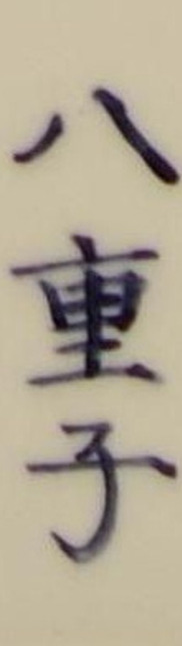八重子
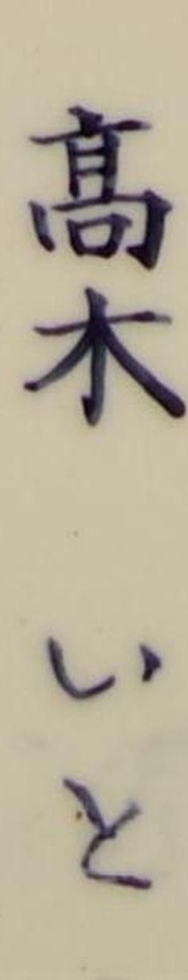高木いと
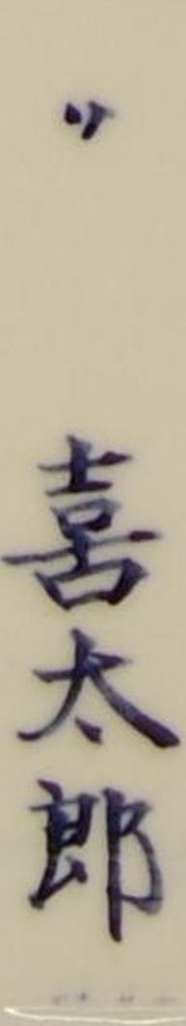喜太郎
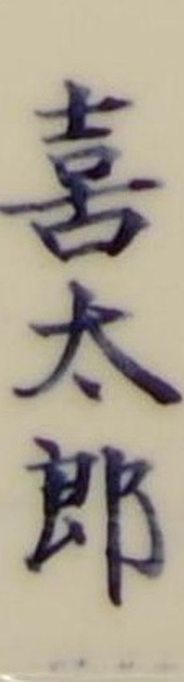喜太郎
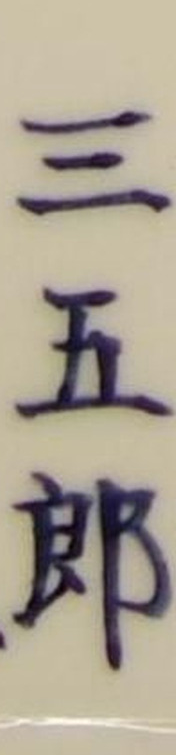三五郎

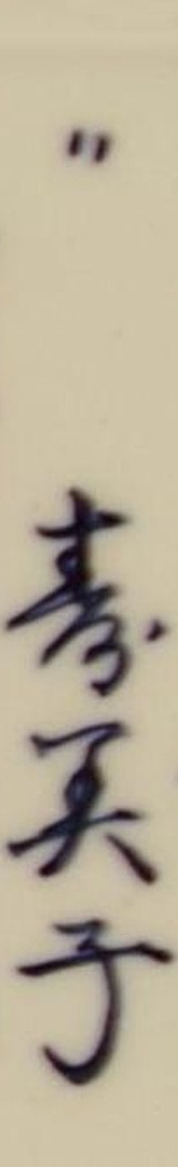寿美子
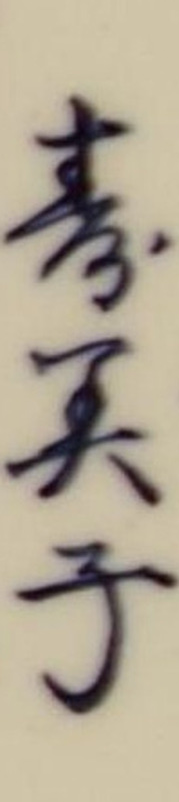寿美子
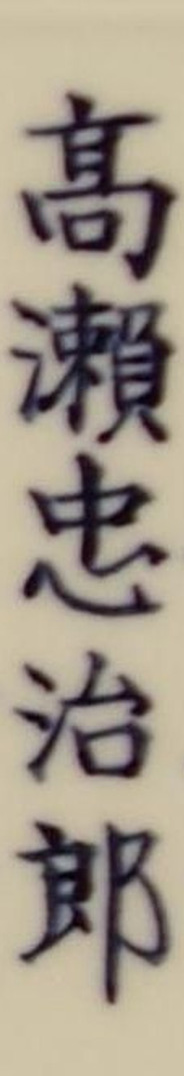高瀬忠治郎
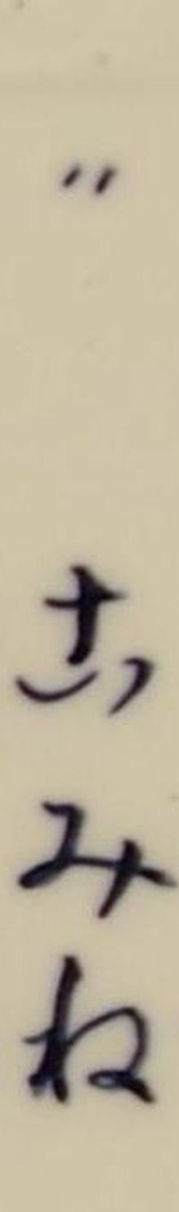こみね
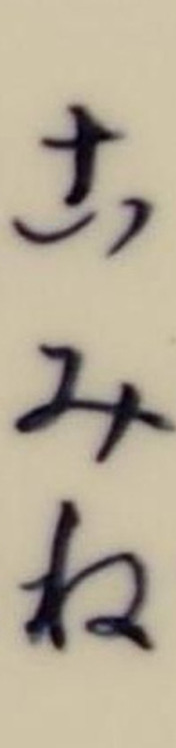こみね
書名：E~L
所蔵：高野山金剛峯寺
